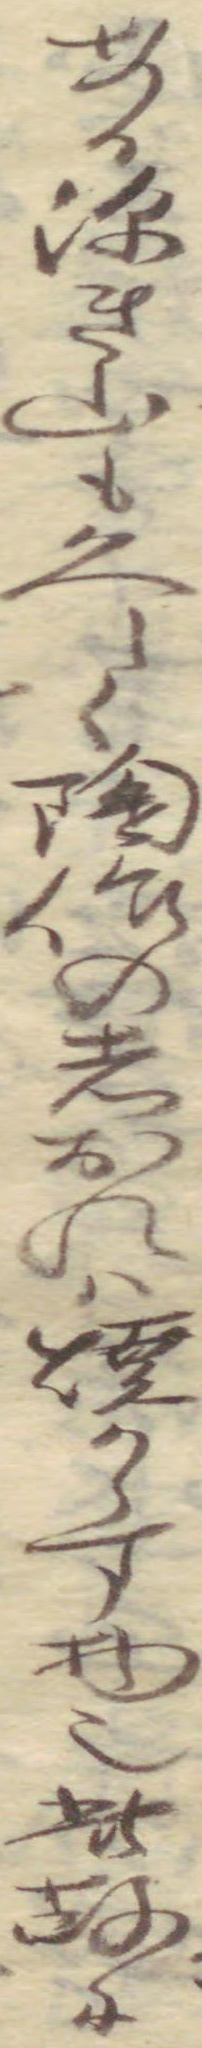なる深き山も久しく陶作の者おれは焼からす物也此故に
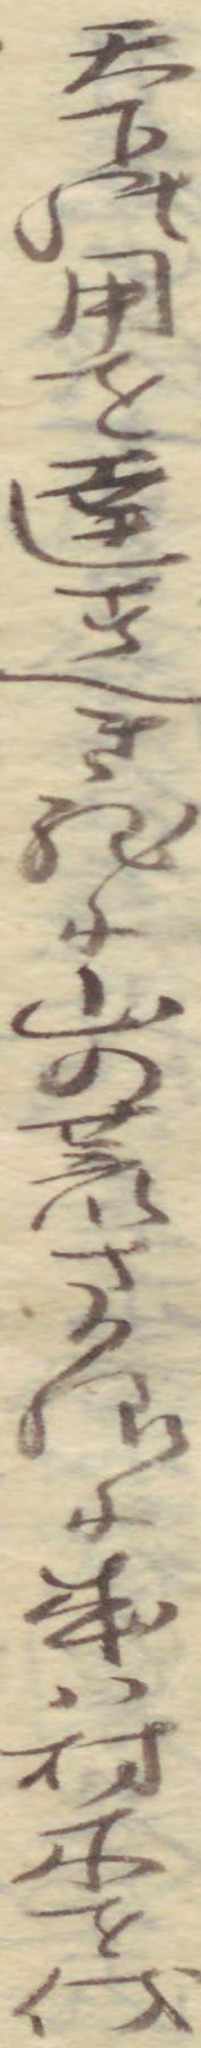天下の用を達すへき程に山の荒さる様に或は材木を伐
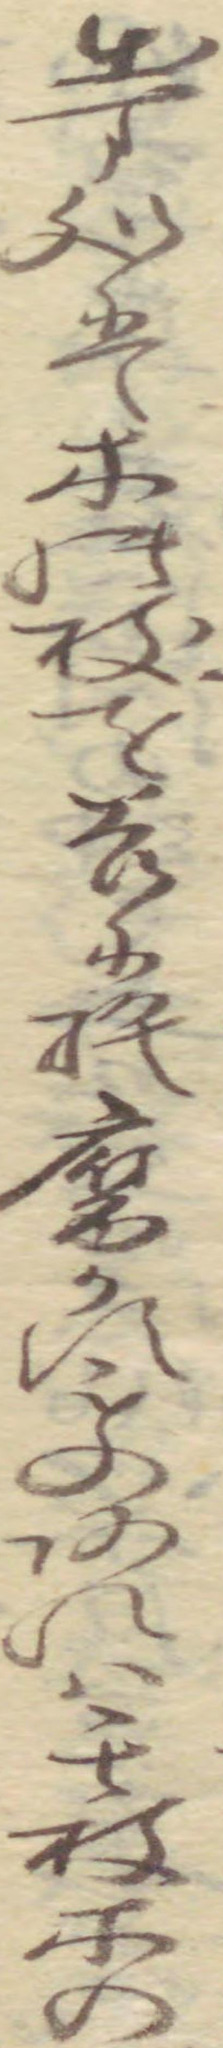出す処にて木の枝を谷に捨腐かすものあれは其枝木の
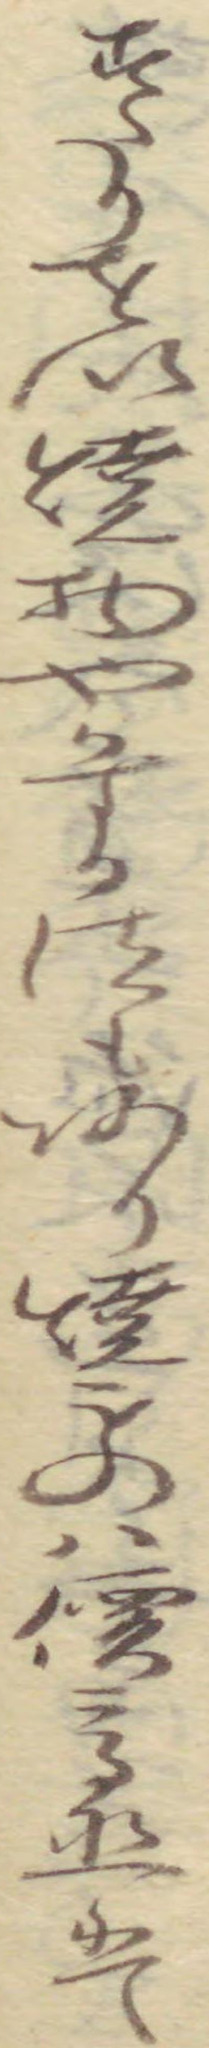すたりを以焼物やかする法もあり焼ものは価高直にて
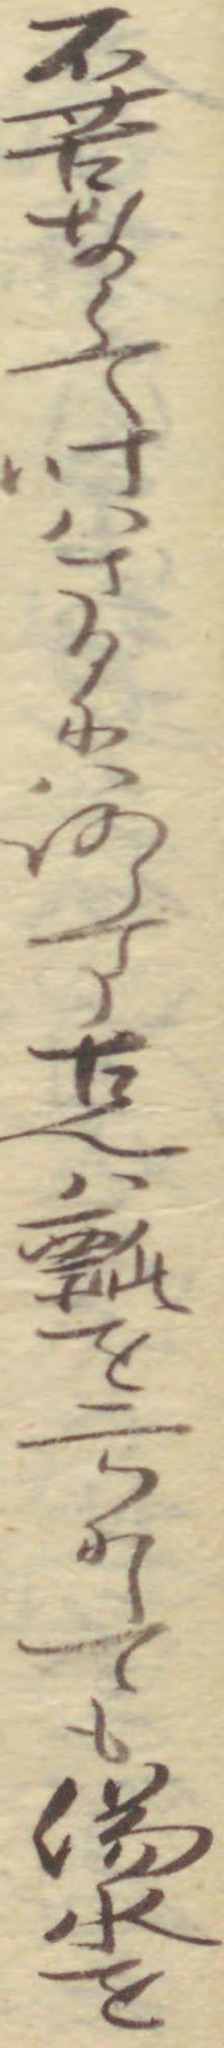不苦ならて叶はさるゝにはあらす古へは瓢を二ツにしても湯水を
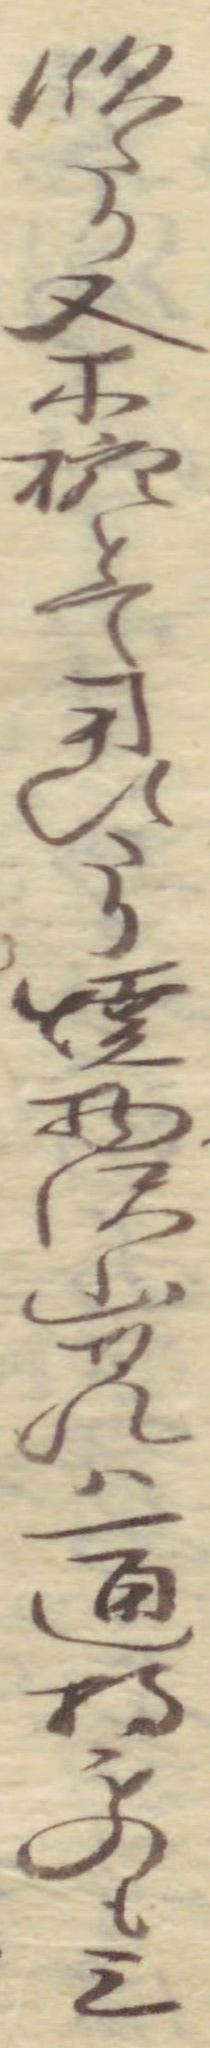飲たり又木椀とて用ひたり焼物沢山なれは一通持ものも三
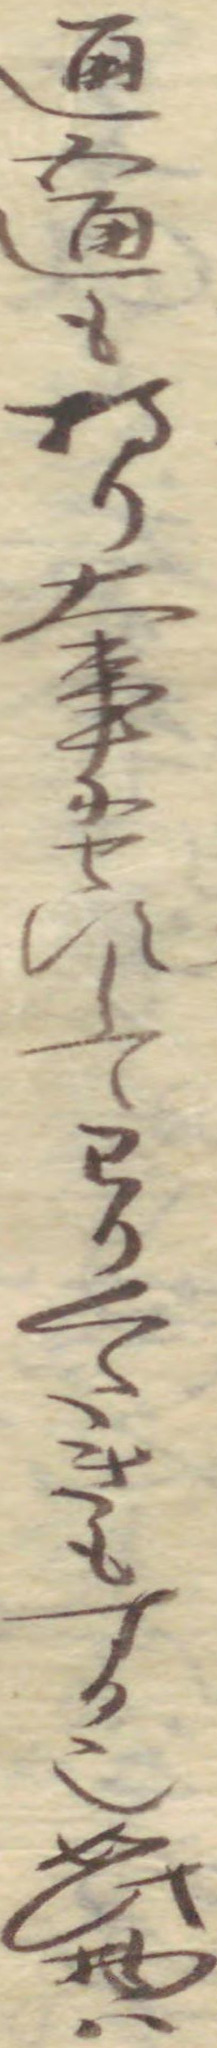通五通も持り大事にせすしてわりくたきもする也如此物は
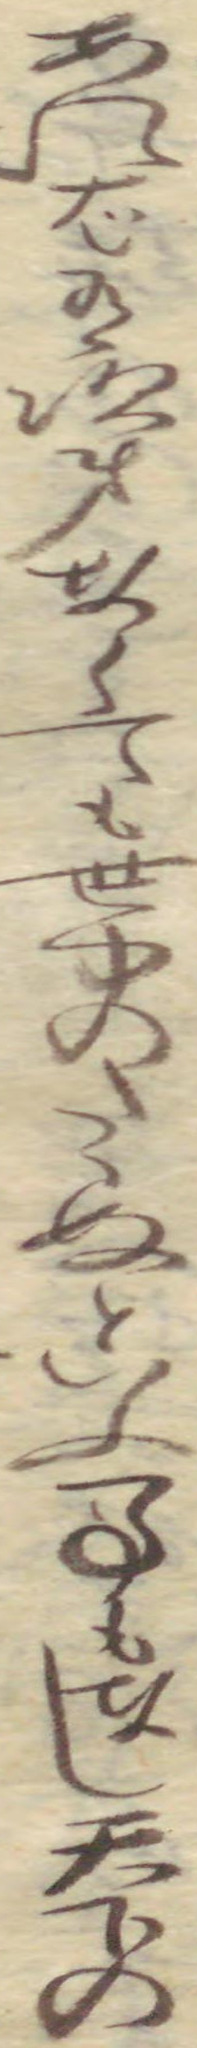あれば有次第なくても世中のたゝぬといふ事もなし天下の
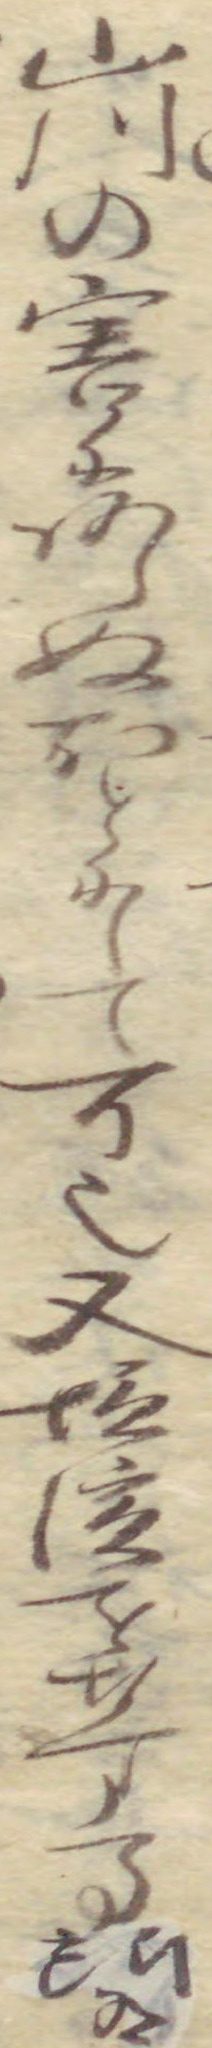山川の害にならぬほとにして可也又塩浜をなす事処有
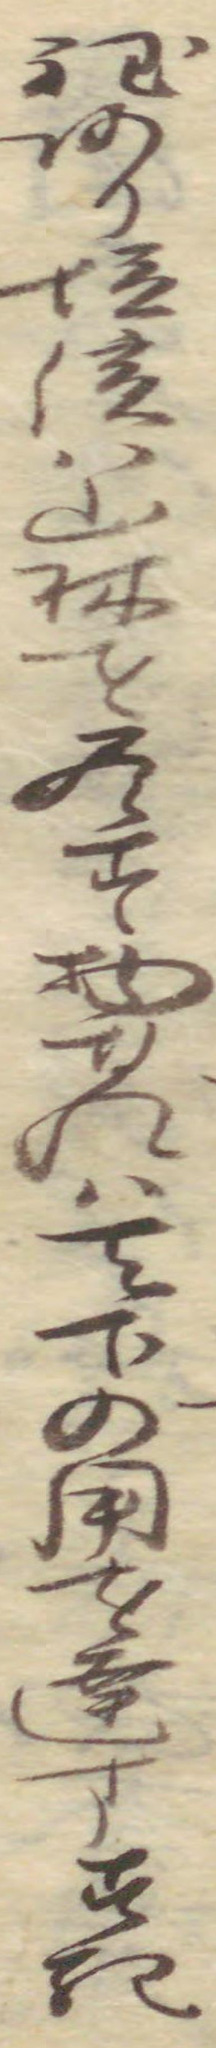程有塩浜は山林を尽す物なれは天下の用を達すすき
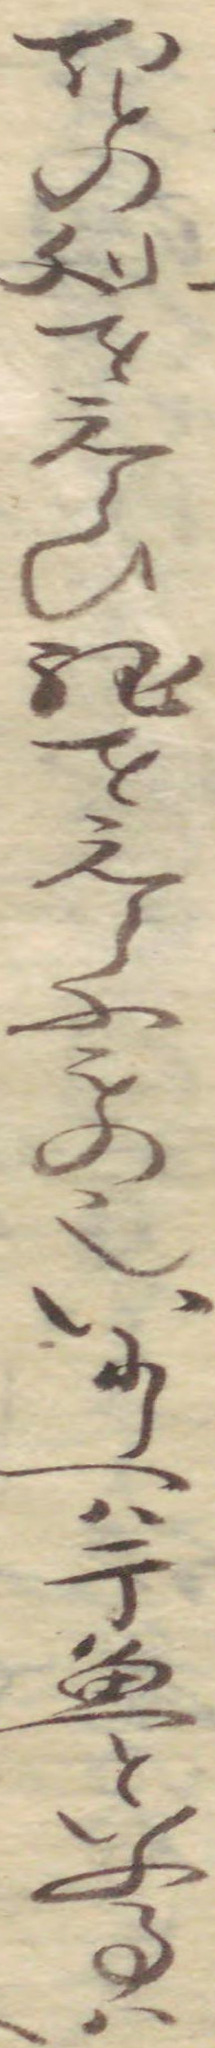ほとの処をえらひ程をえらふもの也いにしへは干魚といふ事は
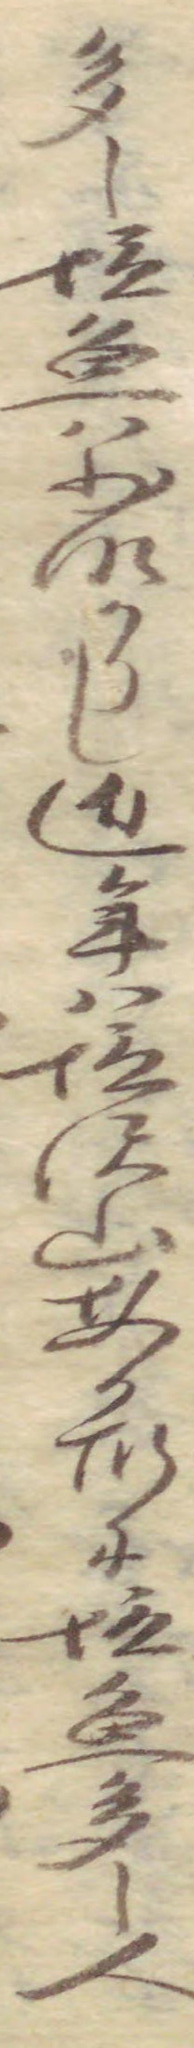多し塩魚は少なかりし近年は塩沢山なる故に塩魚多し人
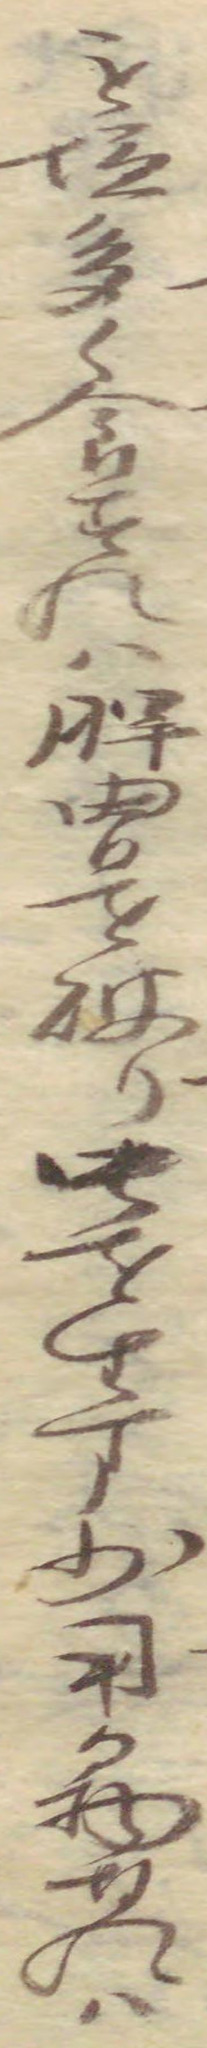も塩多く食すれは脾胃を破り虫を生す少用る物なれは
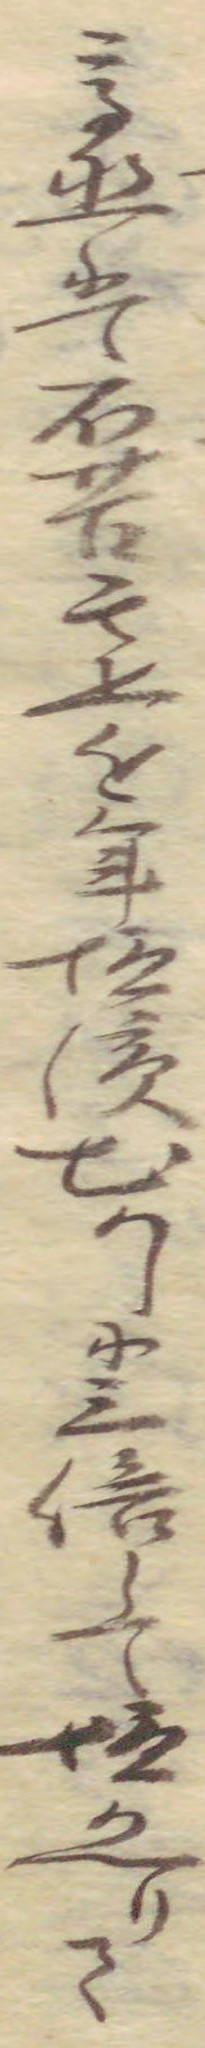高直にて不苦其上近年塩浜むかしに三倍して塩かへりて
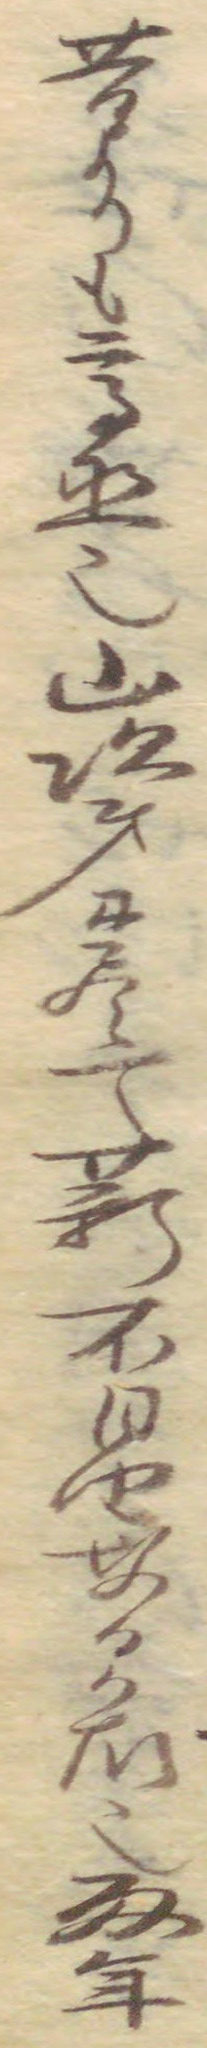昔よりも高直也山次第に尽て薪不自由なるか故也雨年

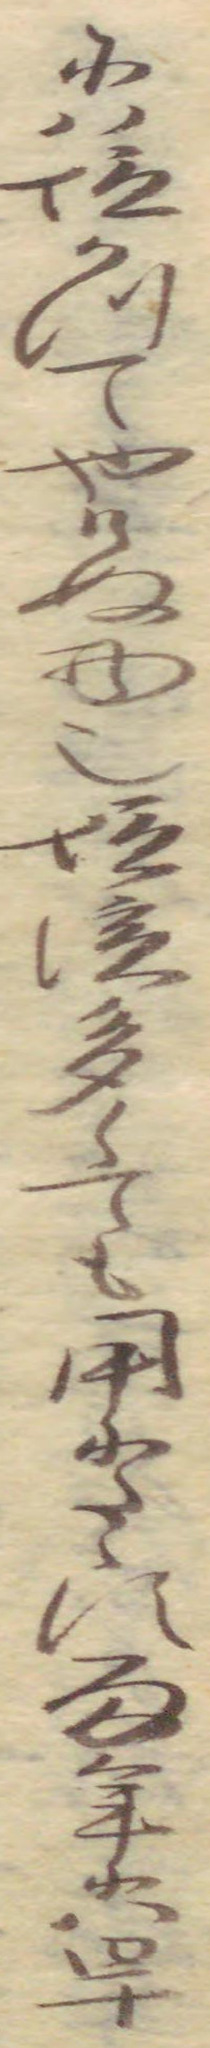には塩かつてやけぬ物也塩浜多くても用にたゝす雨年には旱
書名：鶯宿雑記. 巻263-264
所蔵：国立国会図書館 National Diet Library, JAPAN
